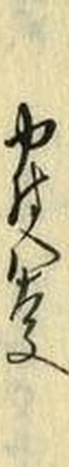野村拾太夫
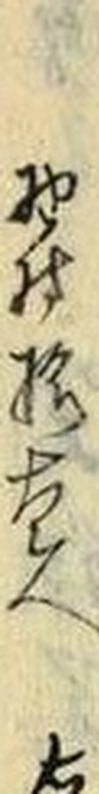野村拾太夫
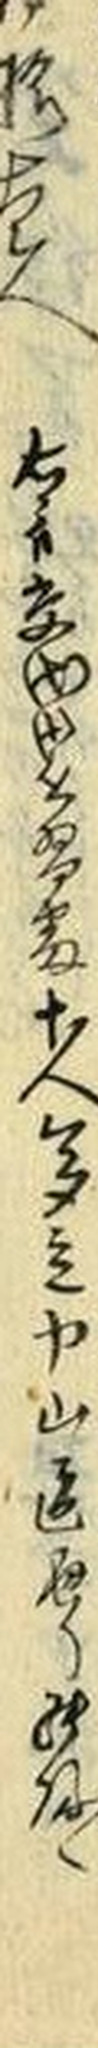右ニ付交代御近習番十人今夕立中山道通り罷帰候
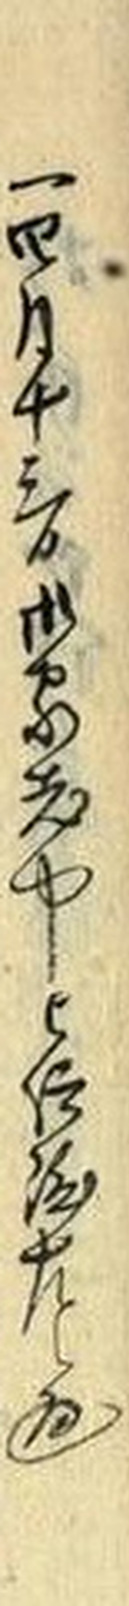一四月十三日御家老中被仰渡左之通
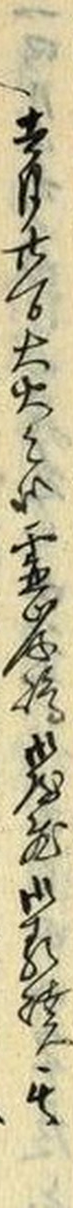去月廿一日大火之処霊岸嶋御屋敷御類焼其
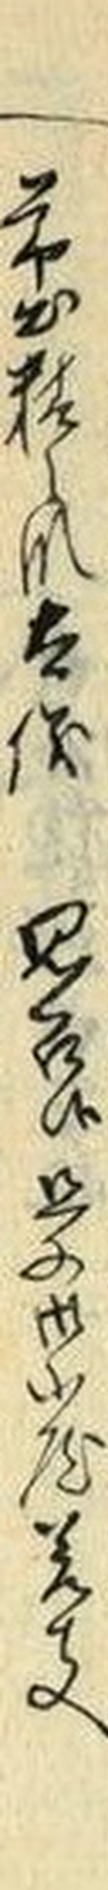節出精之段太儀思召候且又御小屋差支
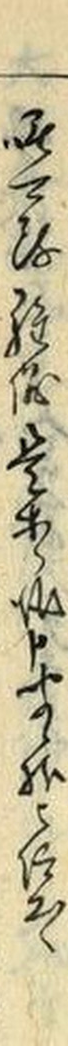嘸可致難儀是等之趣申聞候様被仰出候
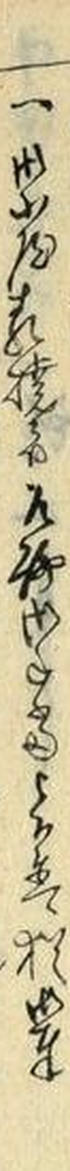一御小屋類焼ニ付乍聊御手当被下置候猶御奉
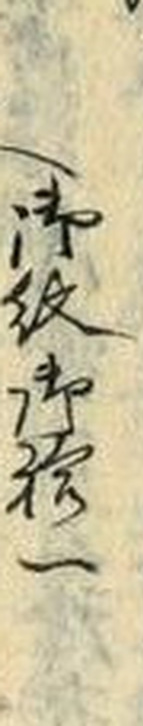御紋御袷一
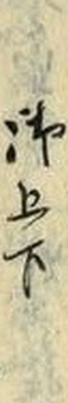御上下
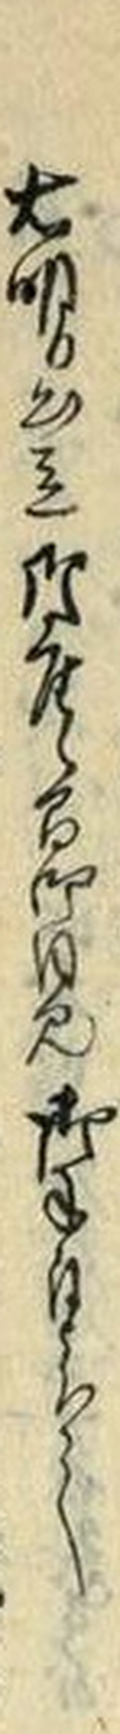右明日出立御座之間御目見御手自被下之同栄太郎
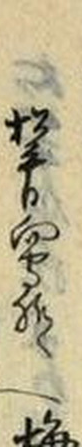松平日向守様へ

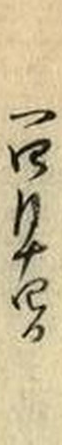一四月十五日
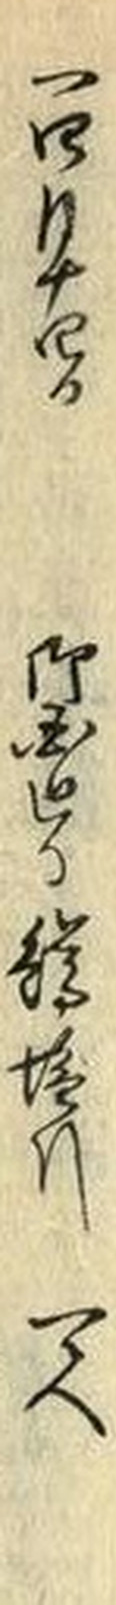一四月十四日御国廻り鱒塩引一尺
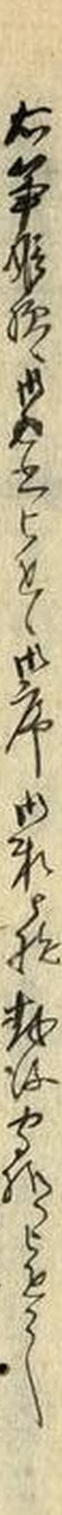右箏姫様へ御返書被進候御序御頼被遊越後守様へ被進之
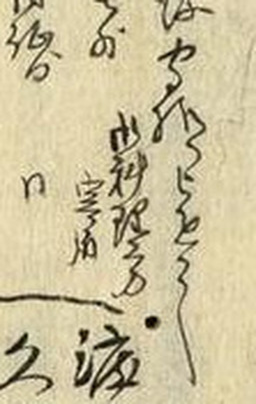御料理方
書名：少傅日録抄（斉承付側向頭取日記、在府）
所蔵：福井県文書館 Fukui Prefectural Archives
